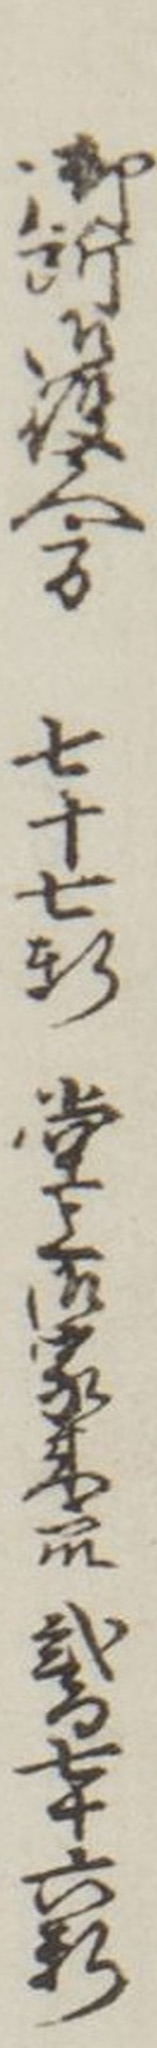御所御役人方七十七軒堂上御家来衆弐百七十六軒
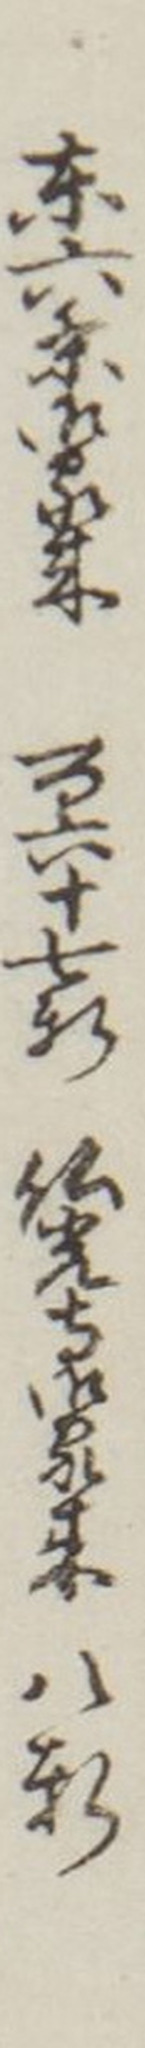東六条御家来百六十七軒仏光寺御家来八軒
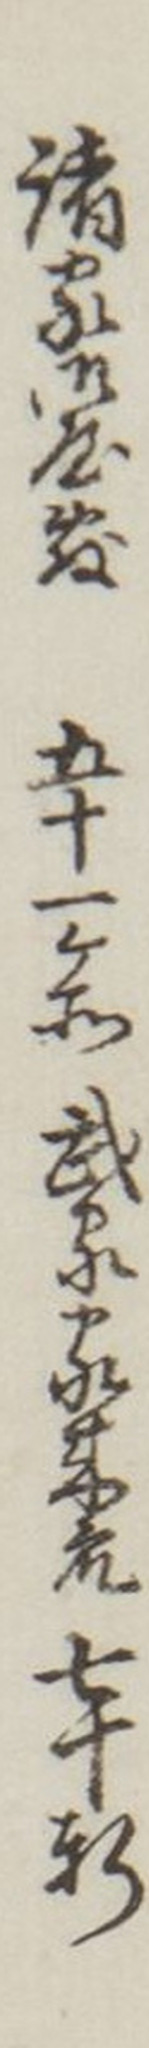諸家御屋敷五十一ヶ所武家家来衆七十軒
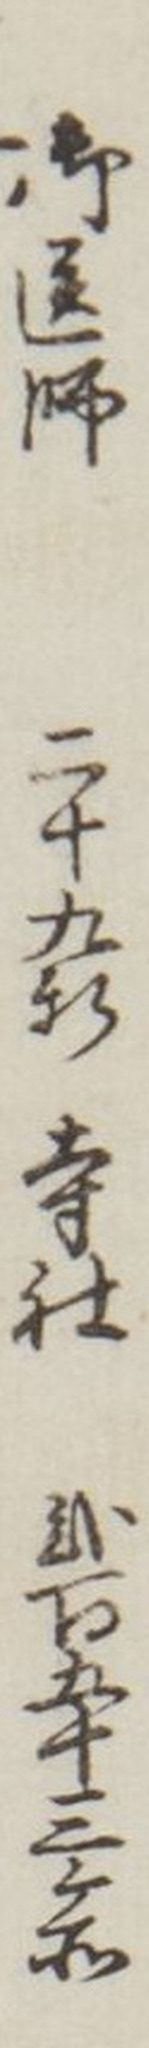御医師二十九軒寺社弐百五十三ヶ所
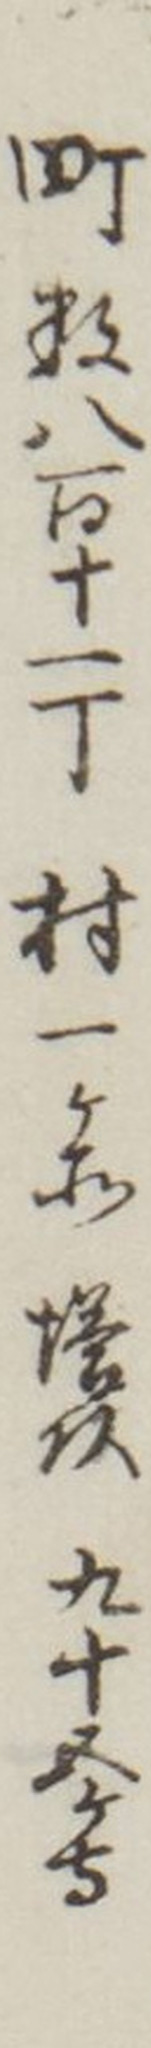町数八百十一丁村一ヶ所塔頭九十五ヶ寺
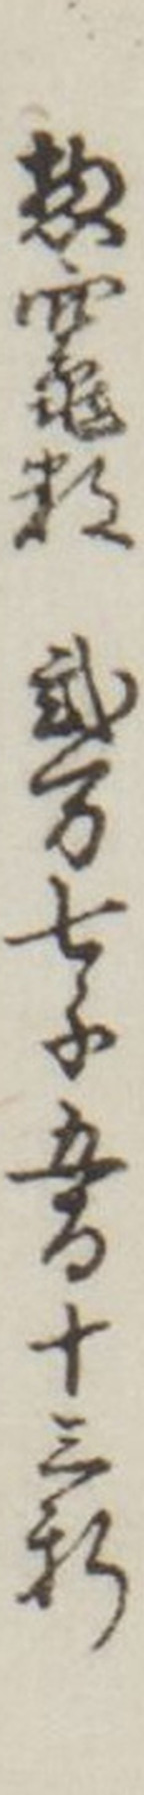惣竃数弐万七千五百十三軒
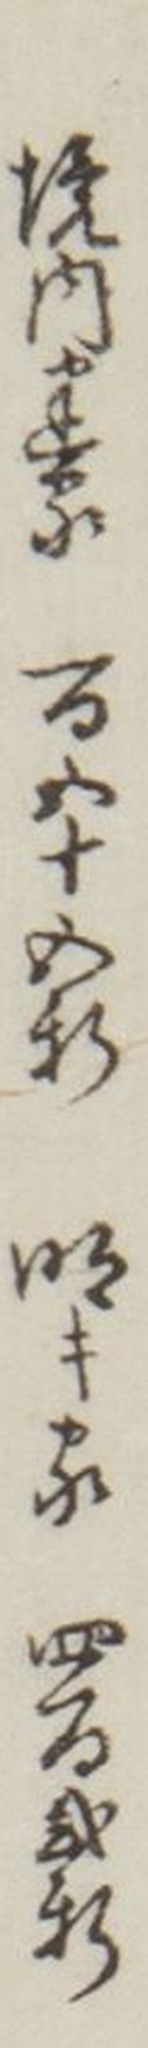境内建家百五十五軒明き家四百弐軒
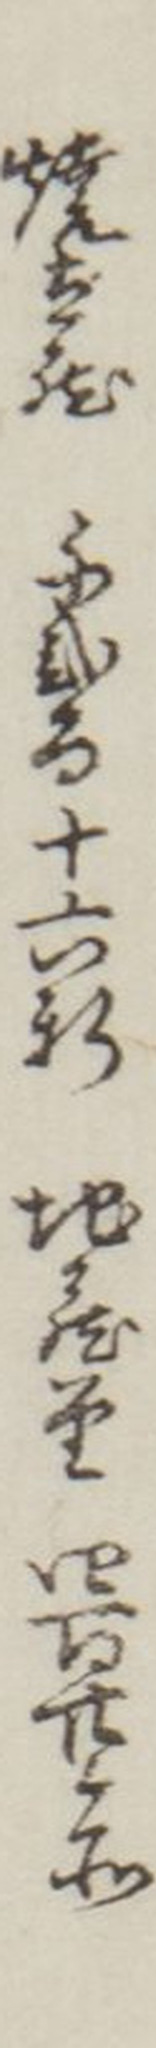焼土蔵千弐百十六軒地蔵堂四百廿ヶ所
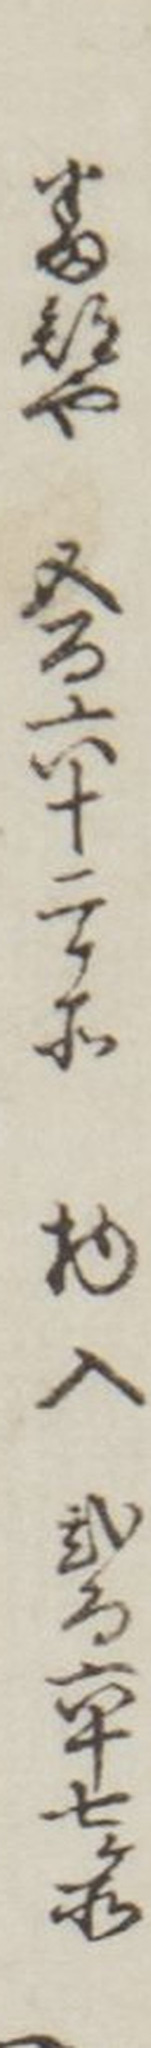番部や五百六十二ヶ所物入弐百六十七ヶ所
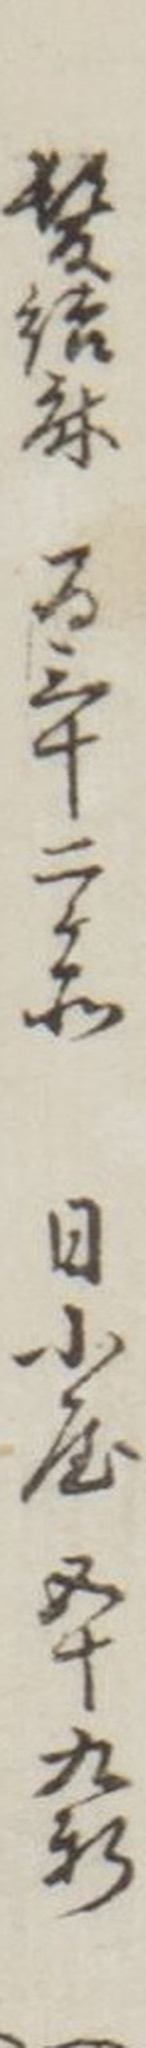髪結床百三十二ヶ所日小屋五十九軒
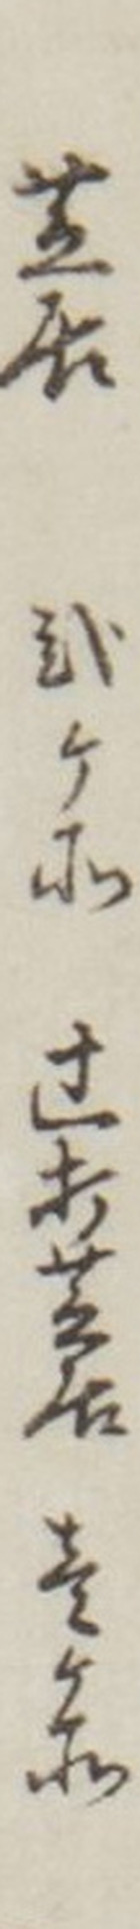芝居弐ヶ所辻打芝居壱ヶ所
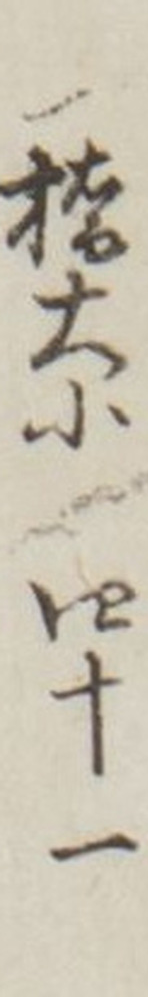橋大小四十一
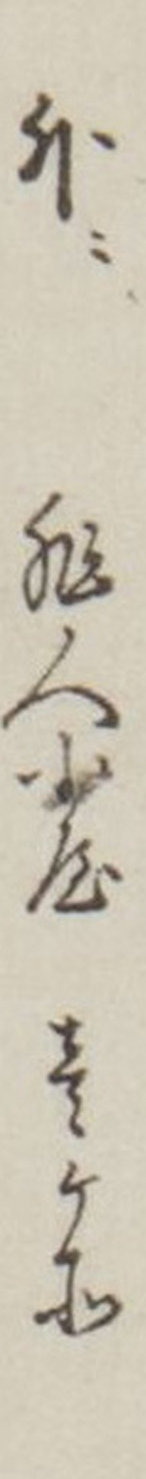外に非人小屋壱ヶ所
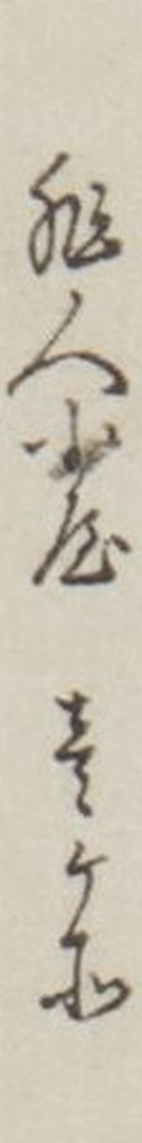外に非人小屋壱ヶ所
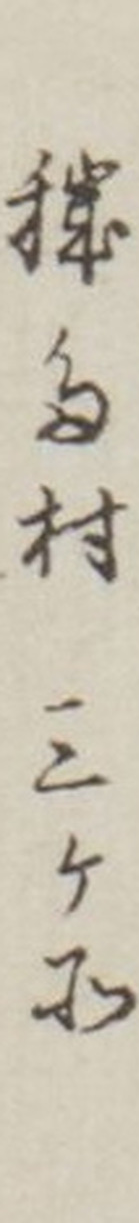穢多村三ヶ所
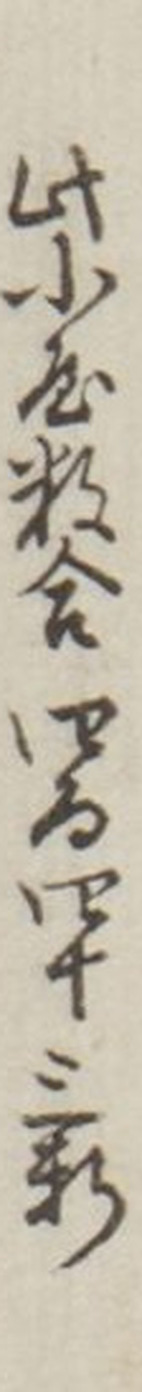此小屋数合四百四十三軒
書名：京都大火記事
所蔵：あいおいニッセイ同和損保株式会社
